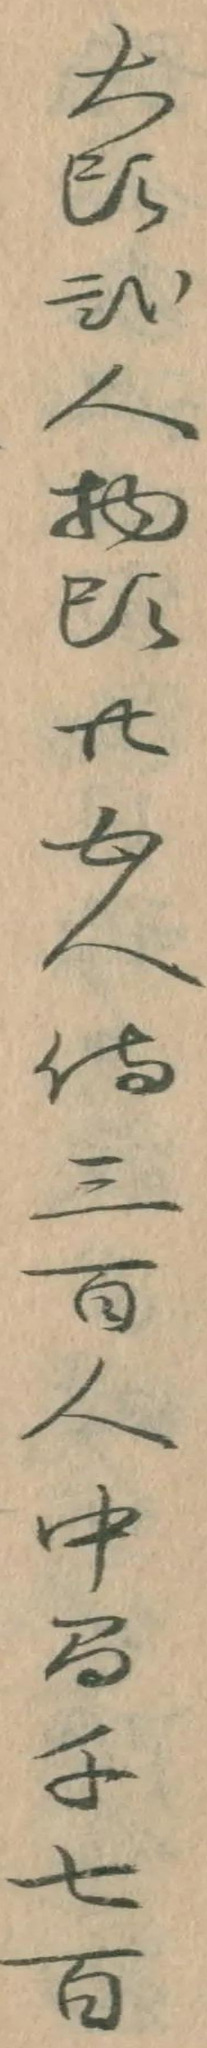大頭弐人物頭廿五人侍三百人中間千七百
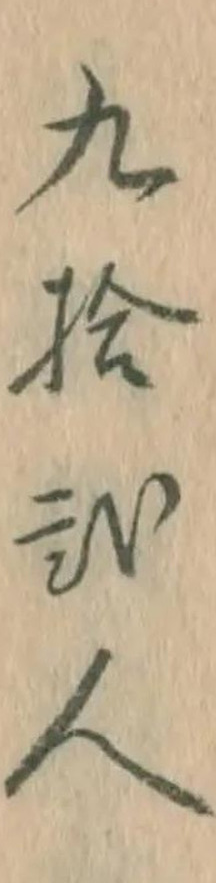九拾弐人

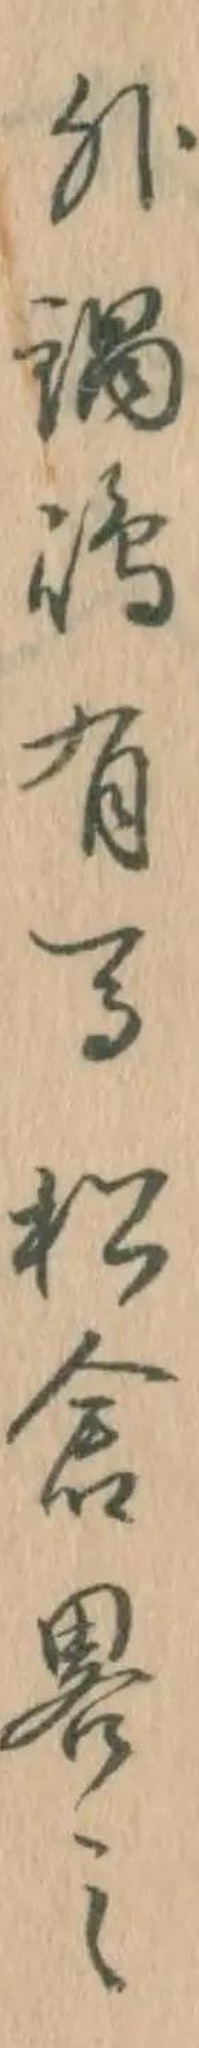外鍋島有馬松倉畧之
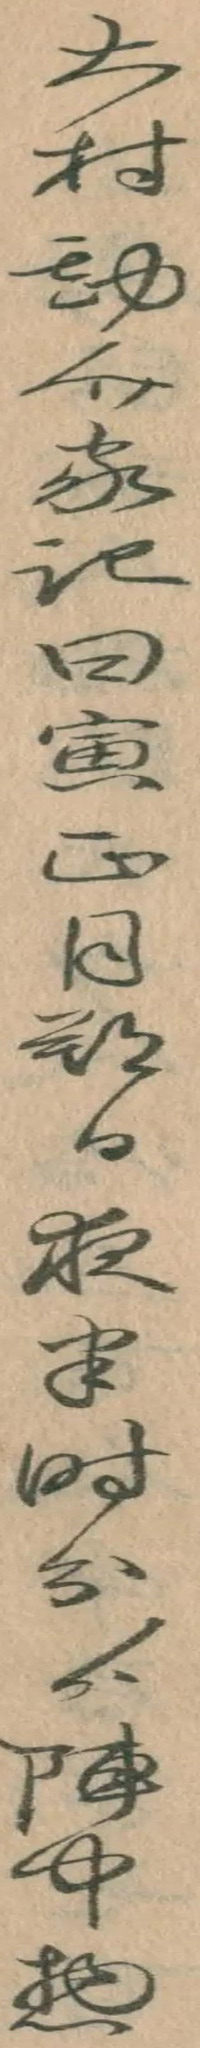大村勘介家記曰寅正月朔日夜半時分ゟ陣中惣
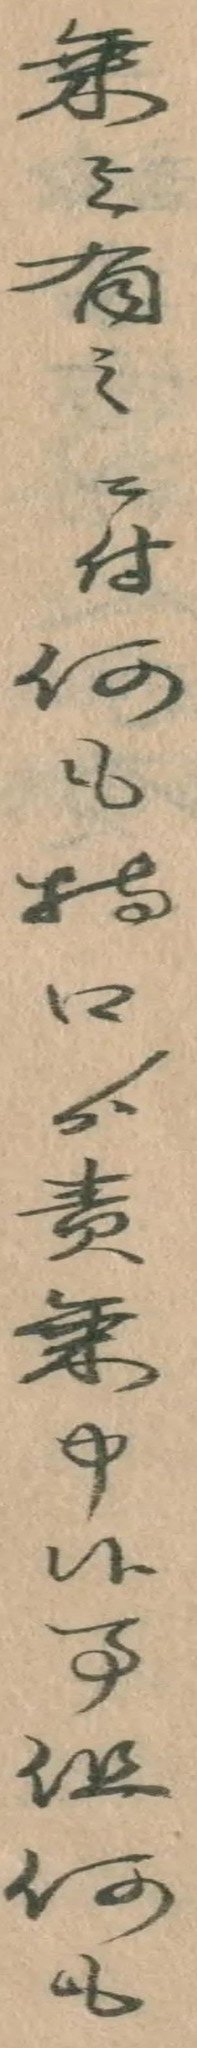乗与有之に付何も持口ゟ責乗申候事但何も
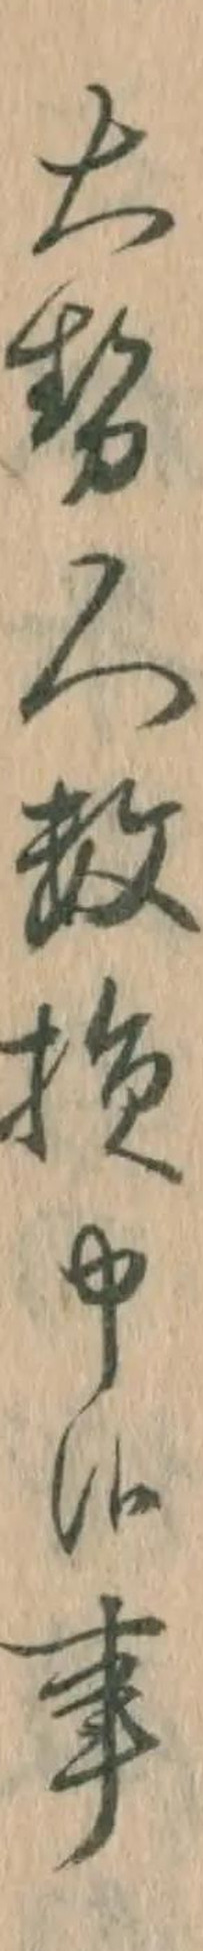大勢人数損申候事
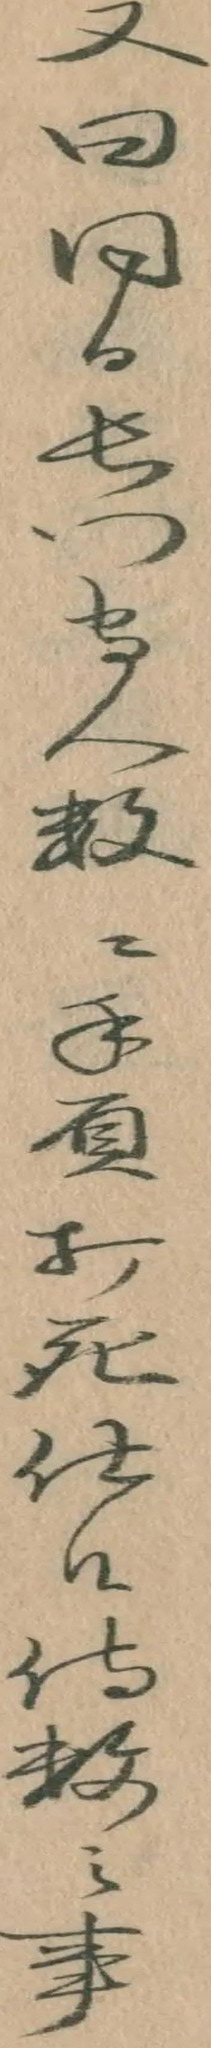又曰同日長門守人数に手負討死仕候侍数之事
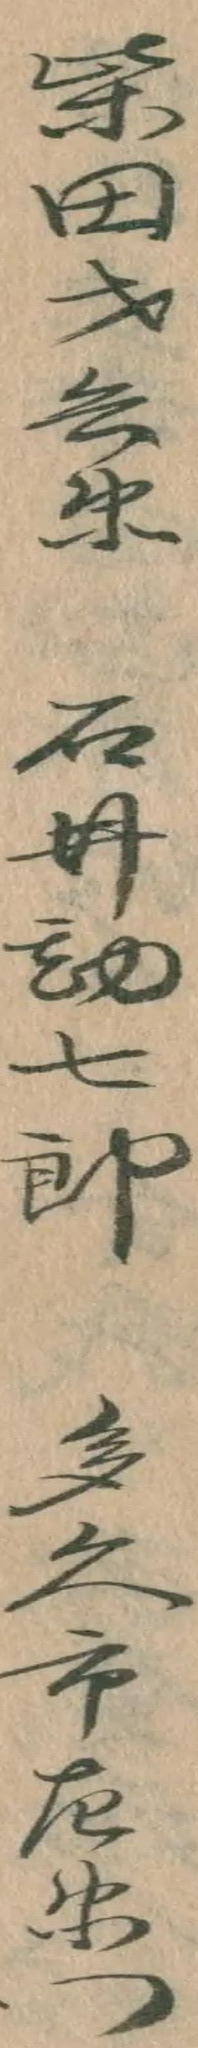柴田才兵衛石井勘七郎多久市左衛門
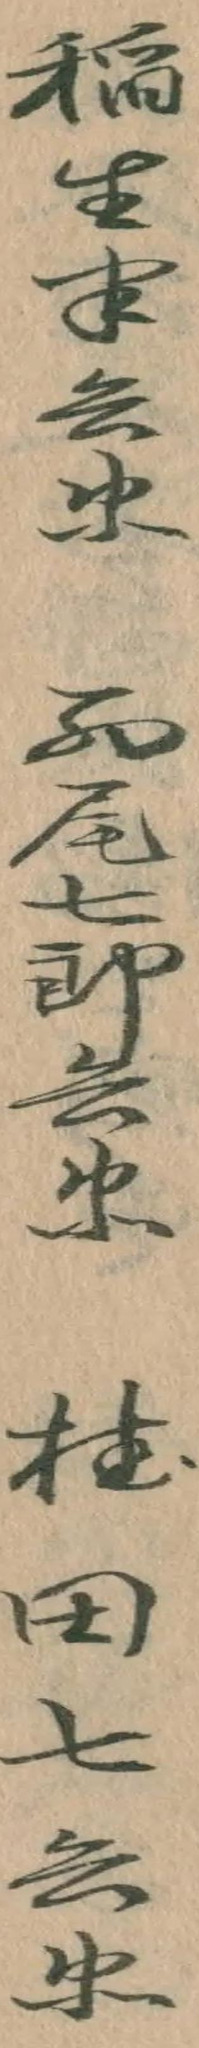稲生半兵衛西尾七郎兵衛桂田七兵衛
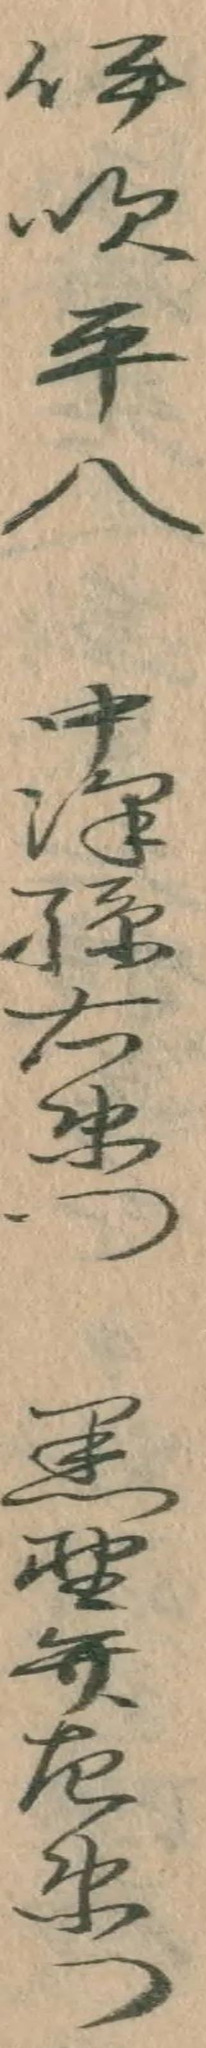伊吹平八中沢孫右衛門黒野弁左衛門
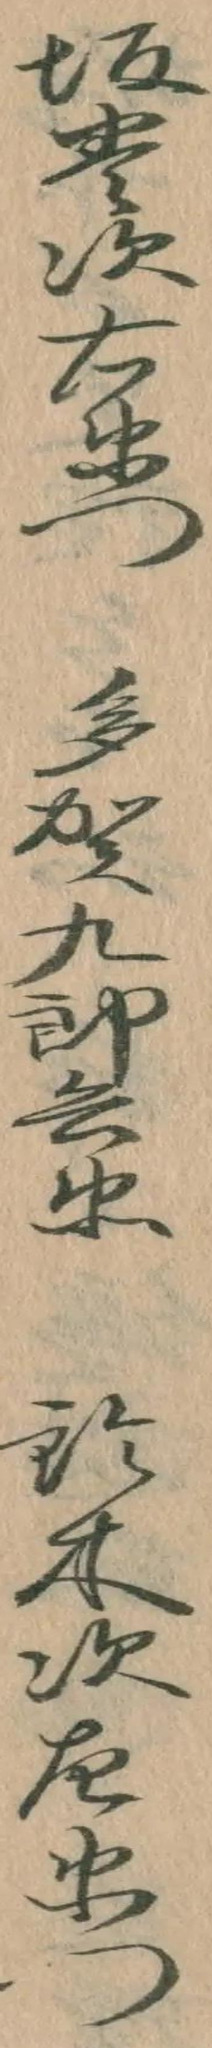坂巻次右衛門多賀九郎兵衛鈴木次左衛門
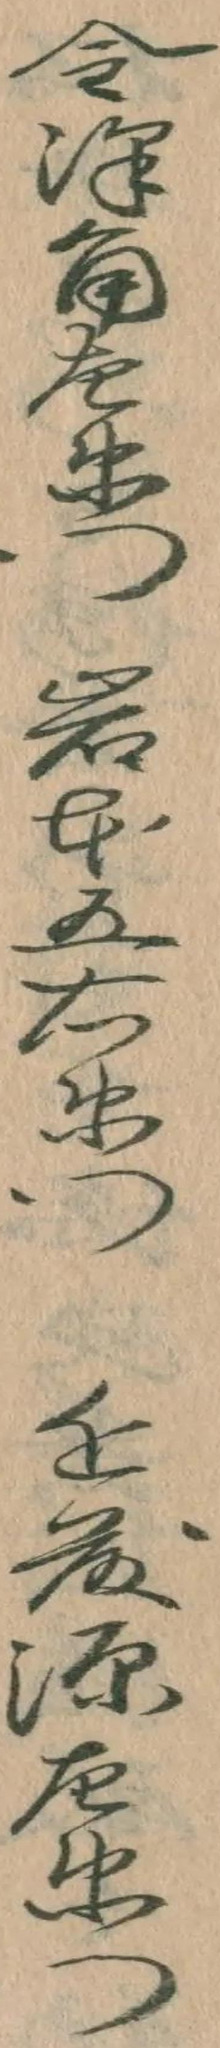金沢角左衛門岩本五右衛門近藤源左衛門
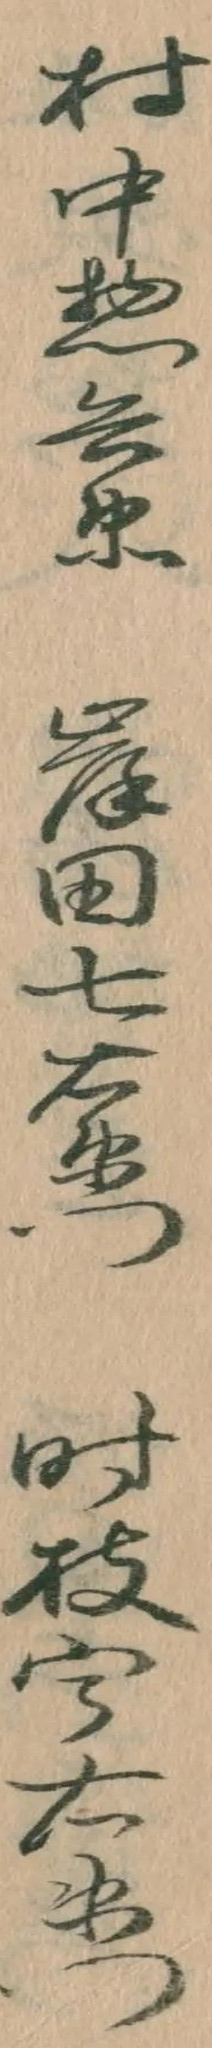村中惣兵衛岸田七右衛門時枝宇右衛門
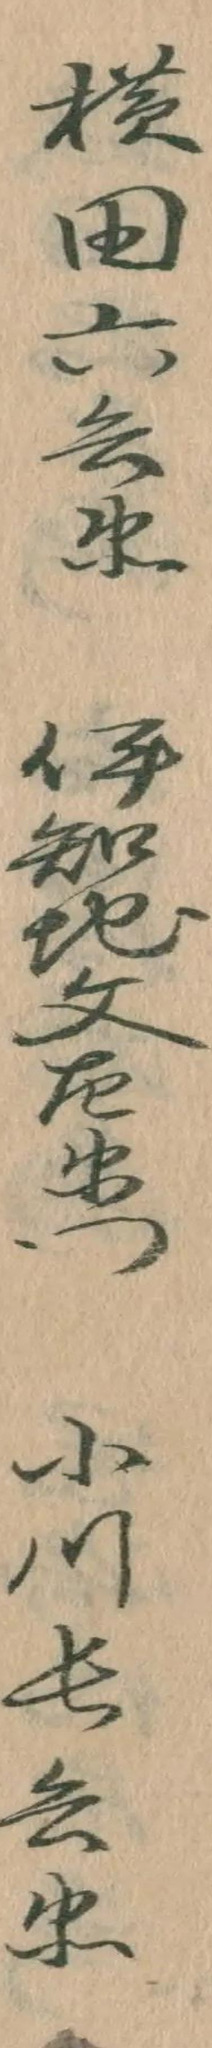横田六兵衛伊知地文左衛門小川長兵衛
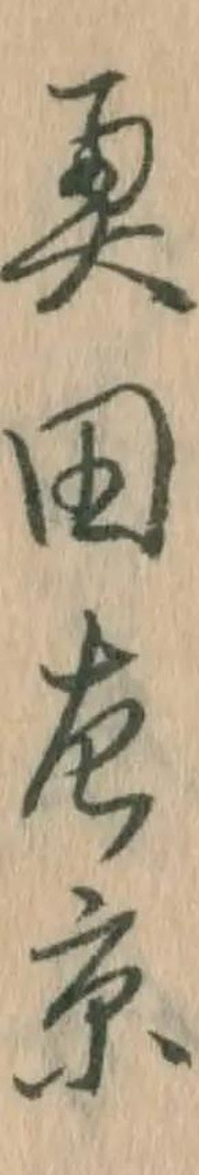奥田左京
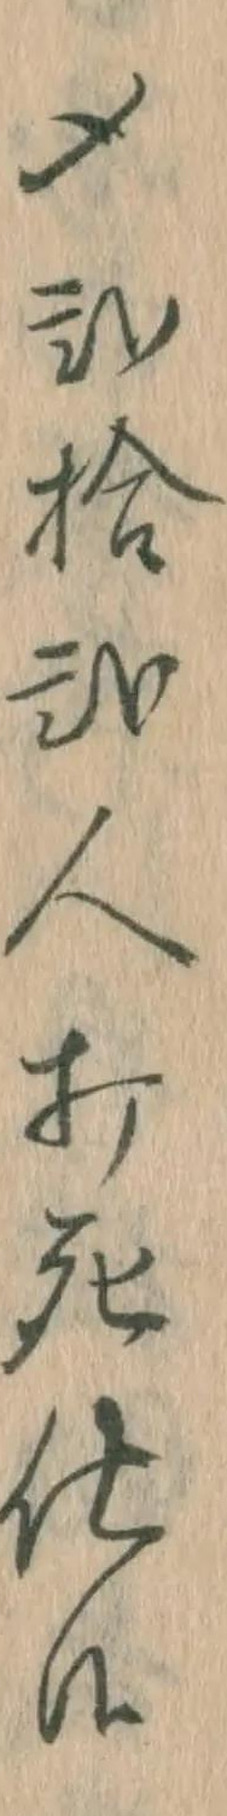〆弐拾弐人打死仕候
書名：切支丹御退治記 49巻. [5]
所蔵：国立国会図書館 National Diet Library, JAPAN
